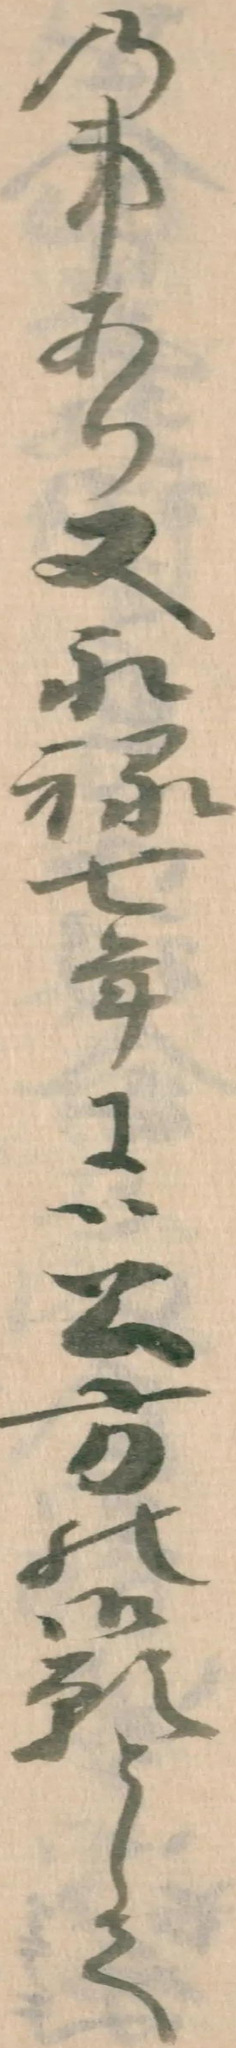の事あり又永禄七年には公方の御願として
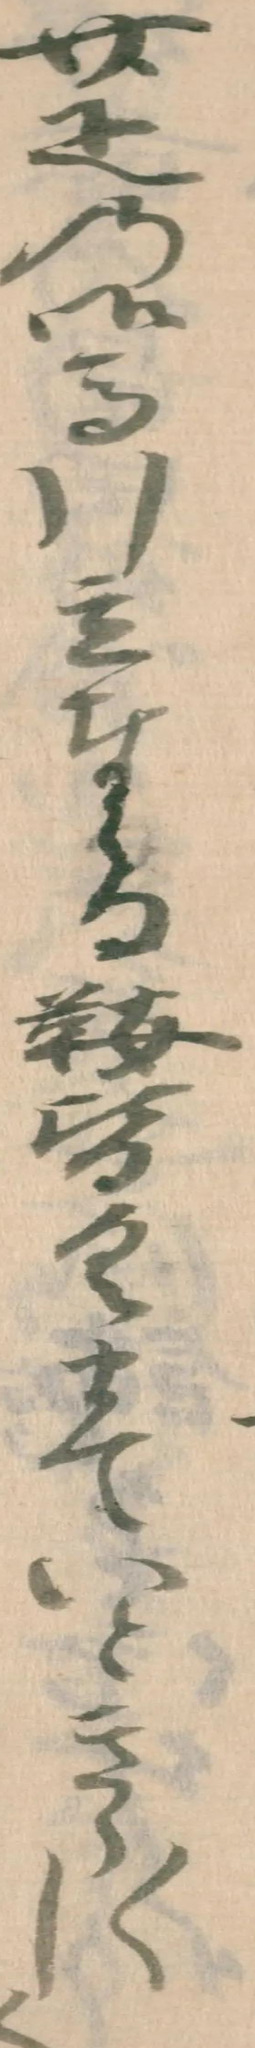廿疋の御馬引立奉らる鞍皆具まていときら〳〵しく
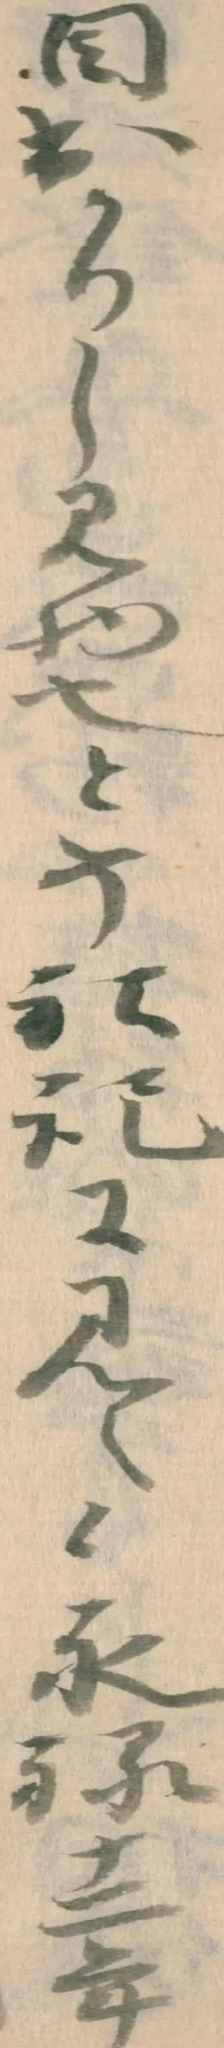目出かりし見物也とそ社記に見え候永禄十二年
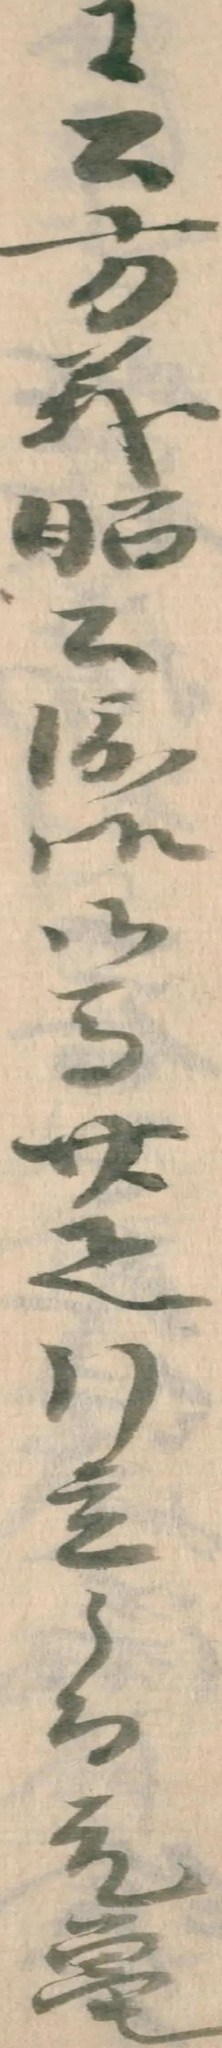に公方義昭公渡御御馬廿疋引立らる元亀
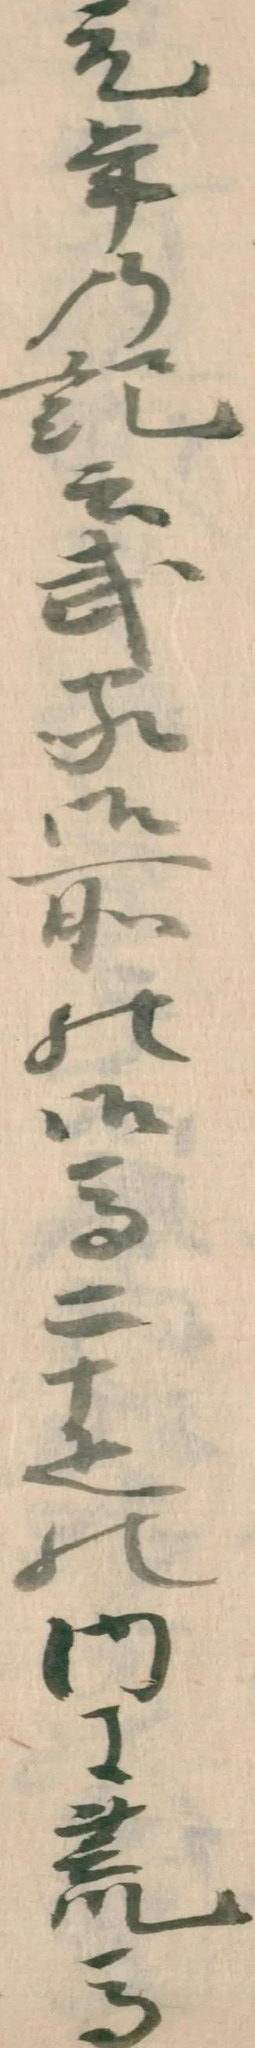元年の記云武家御所の御馬二十疋の内に荒馬
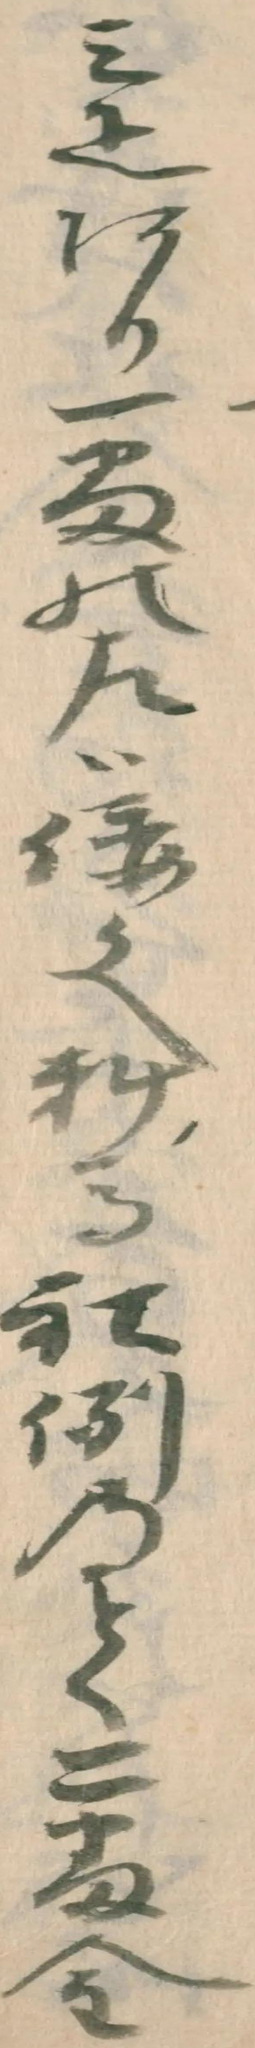三疋あり一番の左は倭文料馬社例のことく二番金
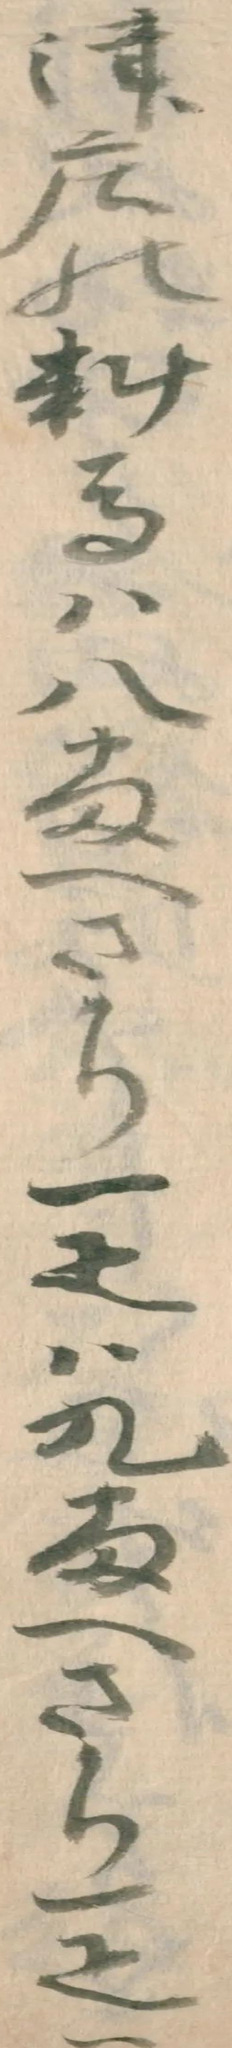津庄の料馬は八番へさかり一疋は九番へさかり一疋は
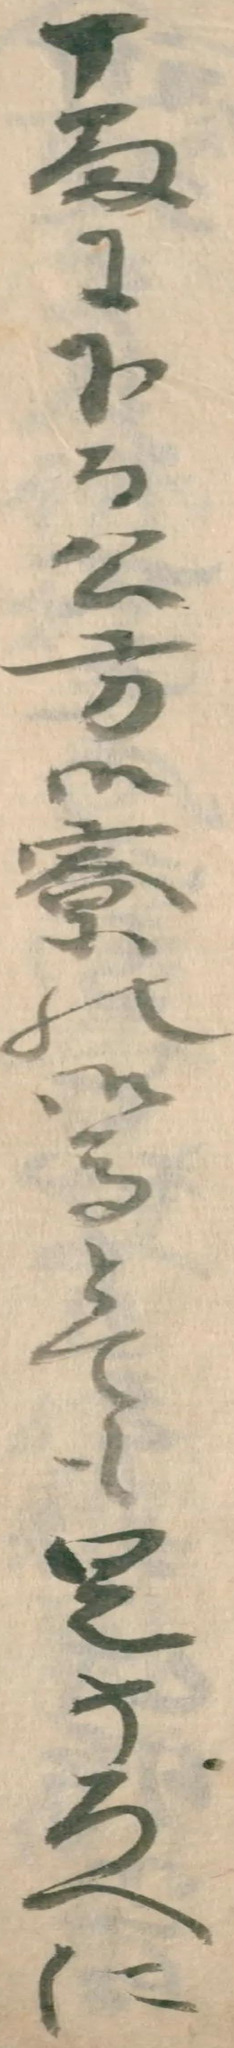十番に下る公方御寮の御馬とても足そろへに
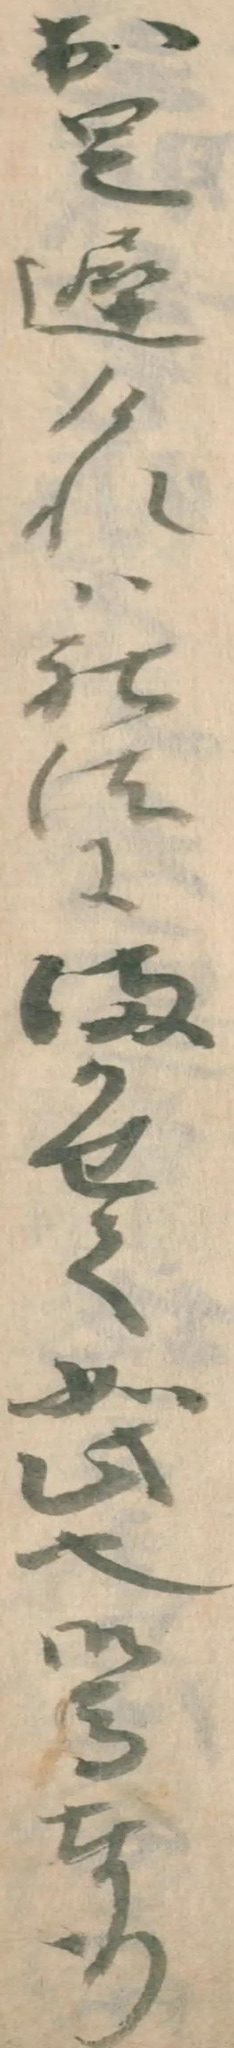出足遅けれは社法にまかせて如此也御馬奉行

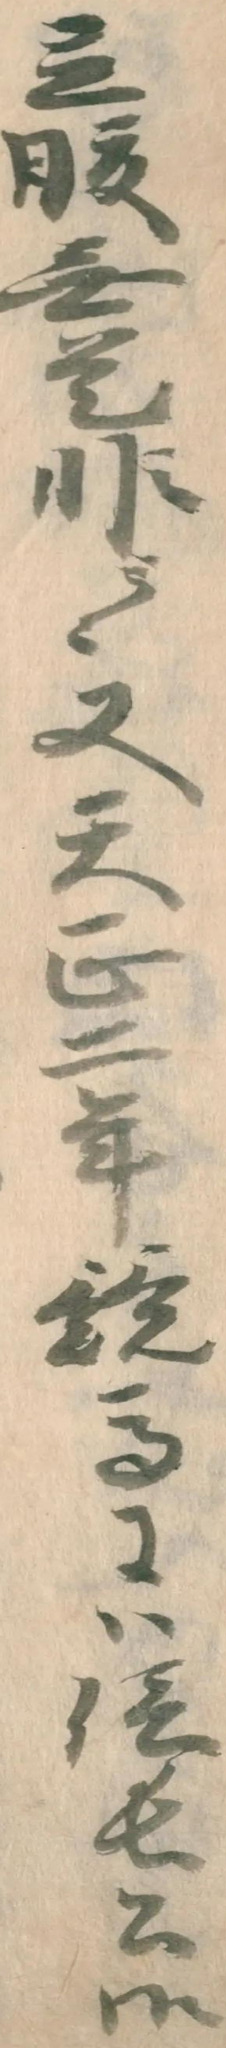立腹無是非云々又天正二年競馬には信長公御
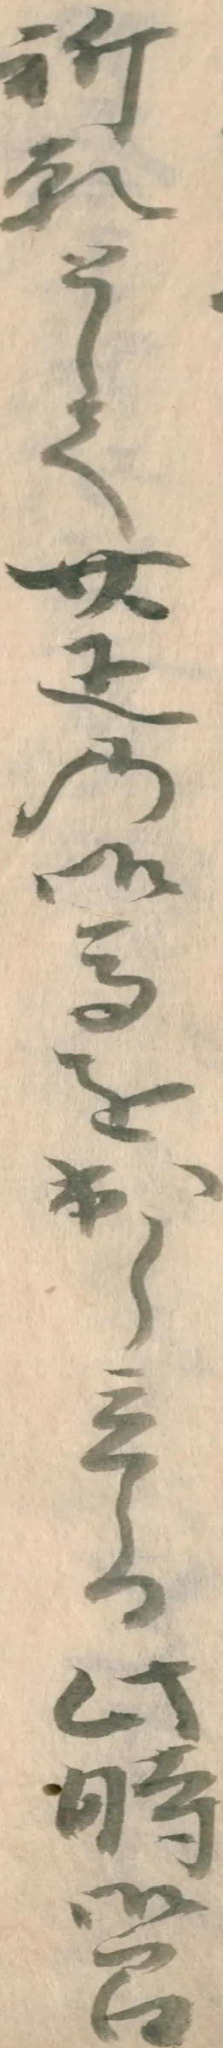祈願として廿疋の御馬を出し立らる此時御召
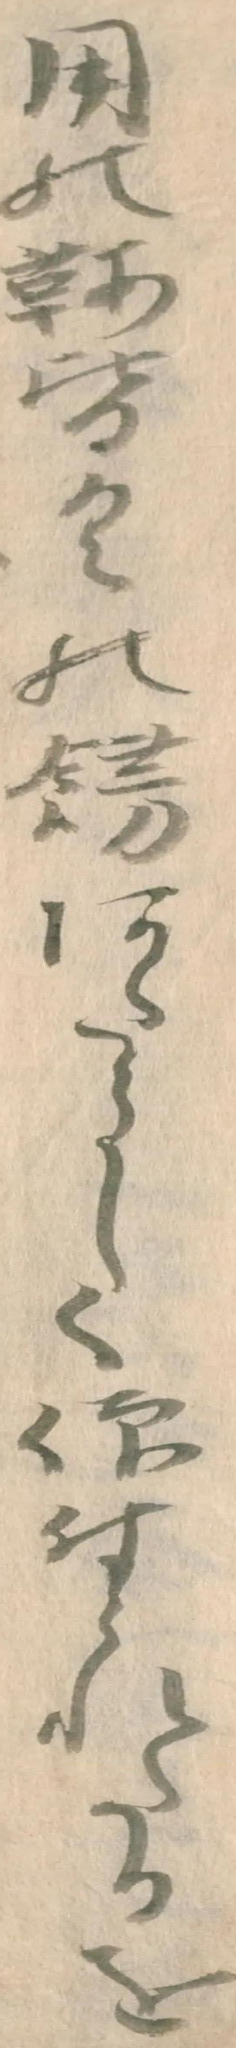用の鞍皆具の餝あたらしく仰付られたるを
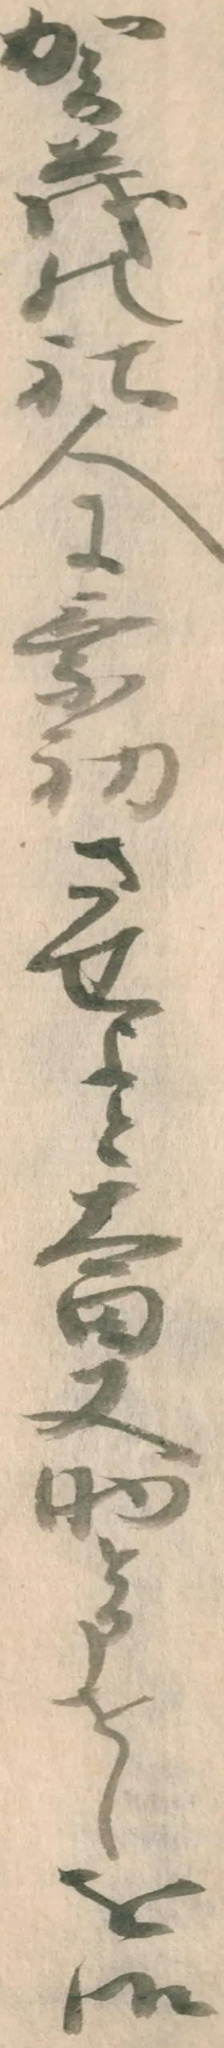賀茂の社人に乗初させよと太田又助と申せしを御
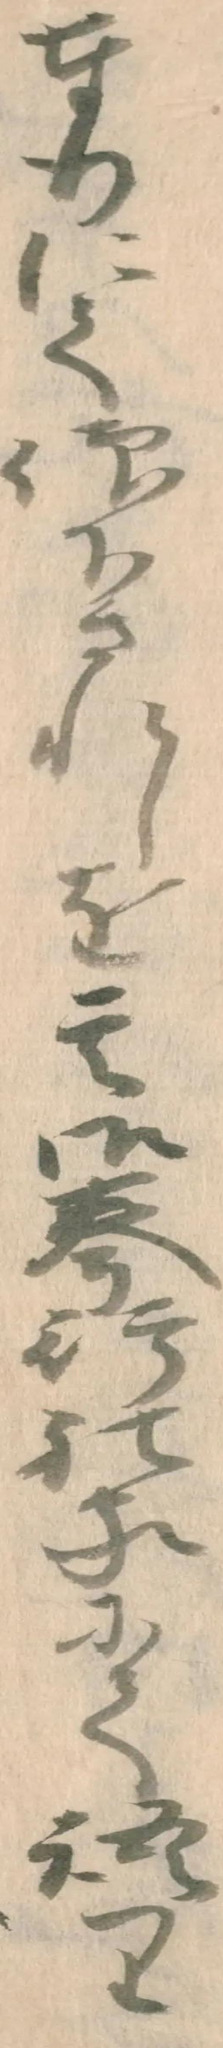奉行にて仰下されしを其御奉行社家にて語り
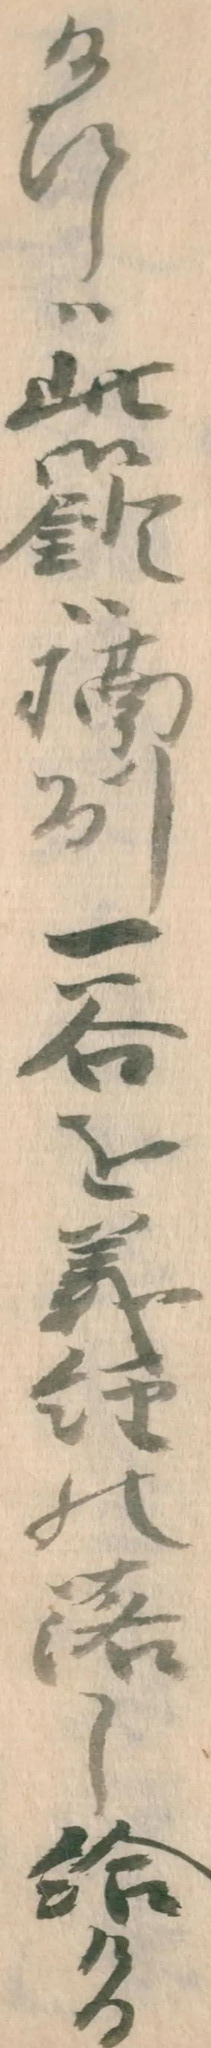給ひしは此御鐙は摂州一谷を義経の落し給ける
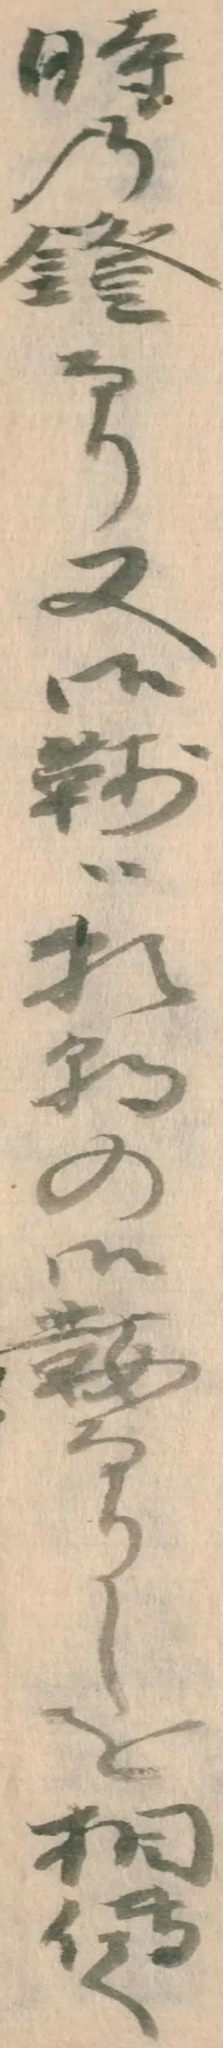時の鐙なり又御鞍は頼朝の御鞍なりしを相伝て
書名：賀茂社記録. 第1冊
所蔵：国立国会図書館 National Diet Library, JAPAN
